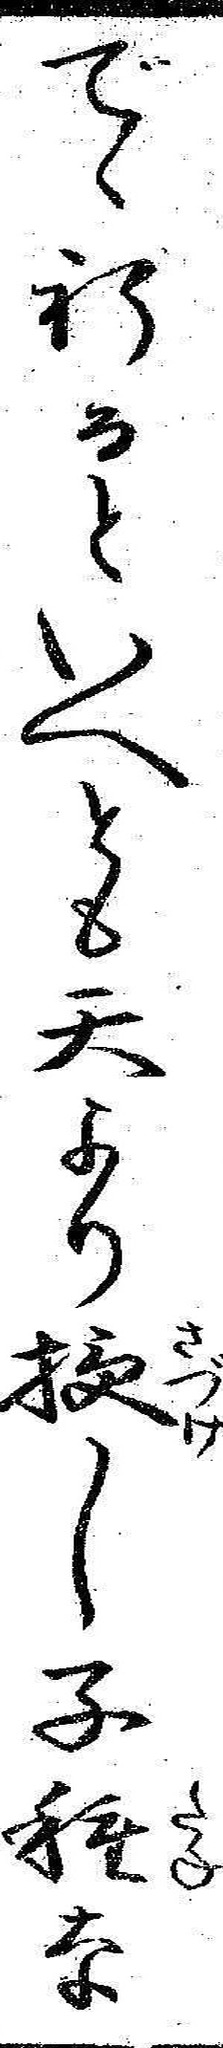でゝ祈るといへとも天より授し子種な
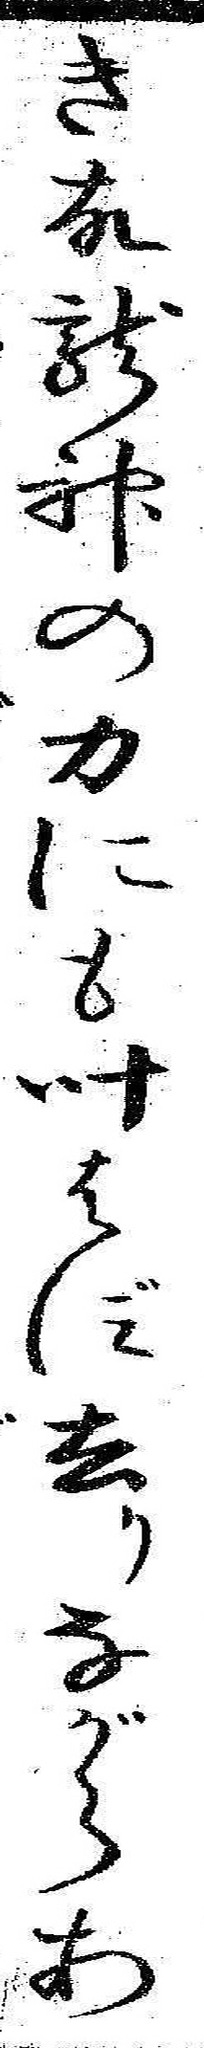き故竜神の力にも叶はず去りながらあ
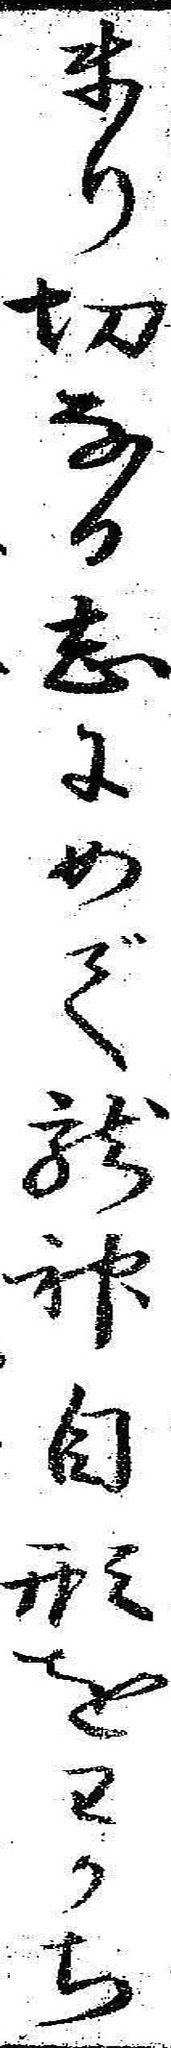まり切なる志にめで竜神自形をわかち
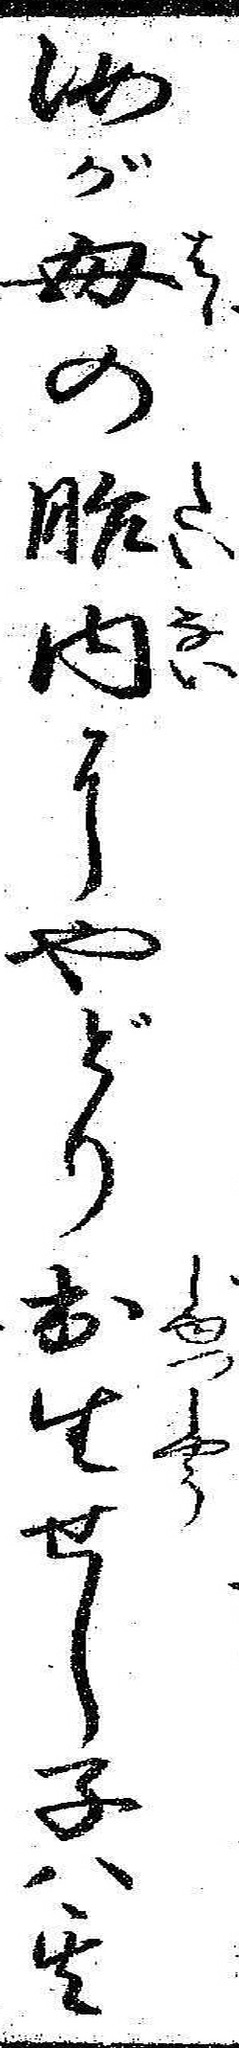汝が母の胎内にやどり出生せし子は其
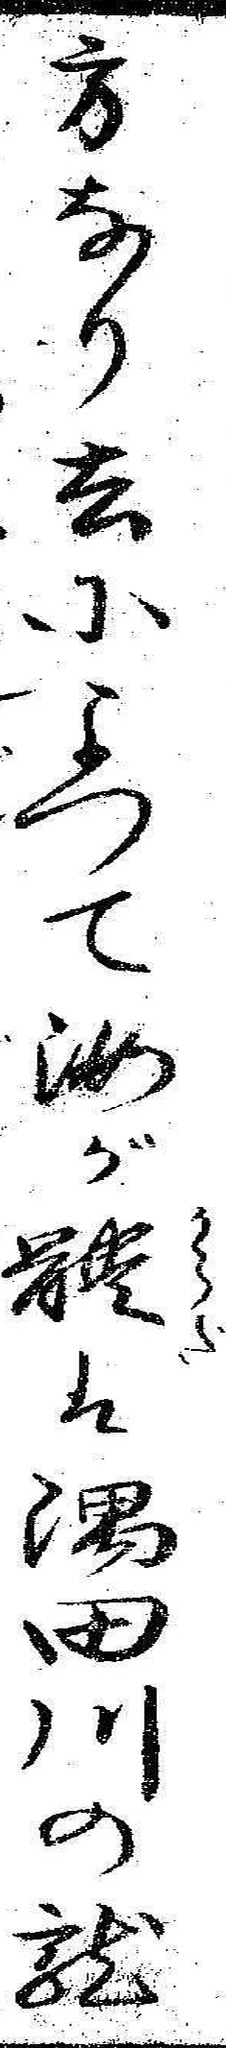方なり去によつて汝が体は隅田川の竜
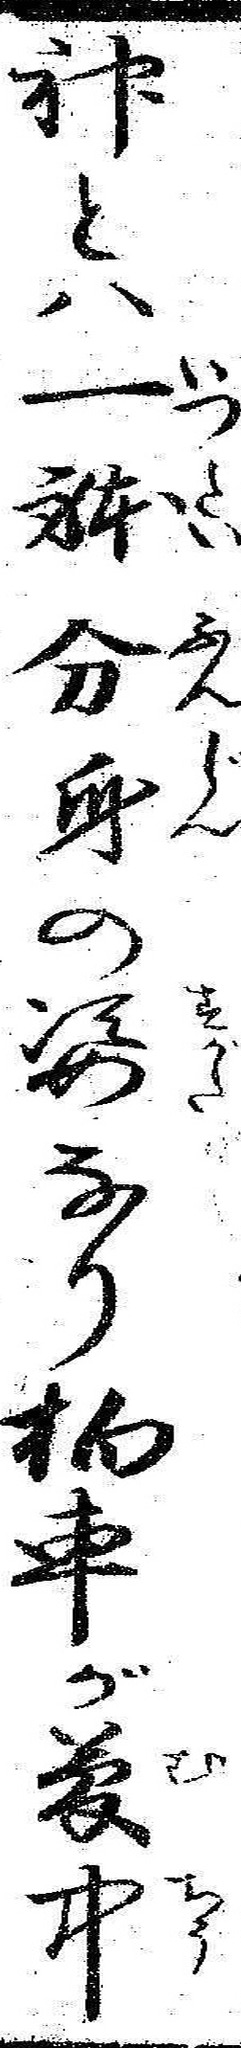神とは一体分身の姿なり栢車が夢中

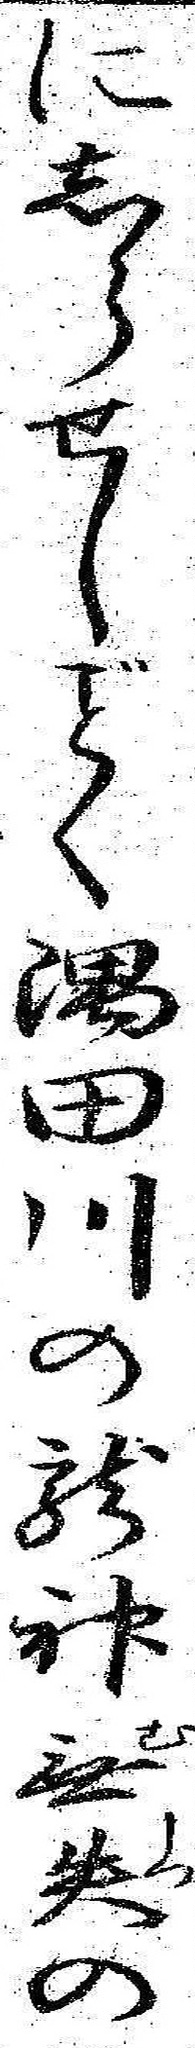にしらせしごとく隅田川の竜神無失の
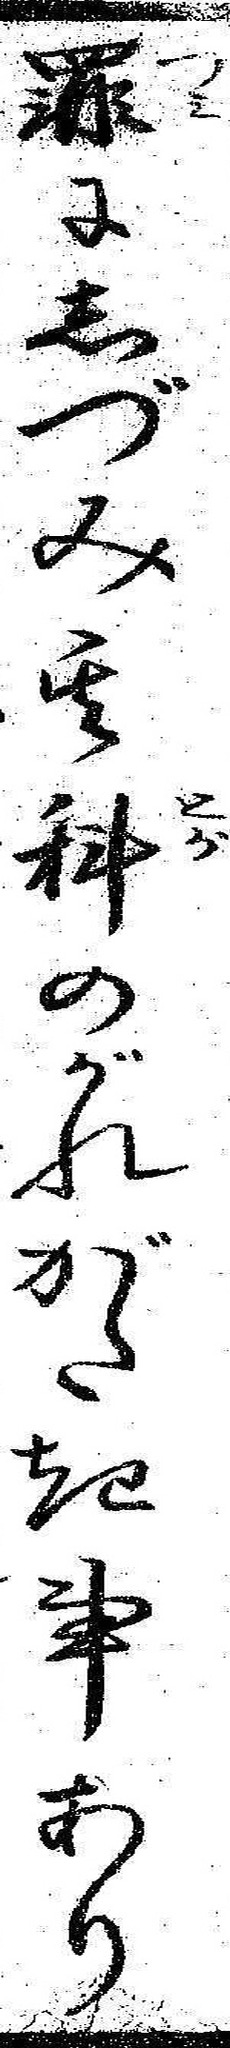罪にしづみ其科のがれがたき事あり
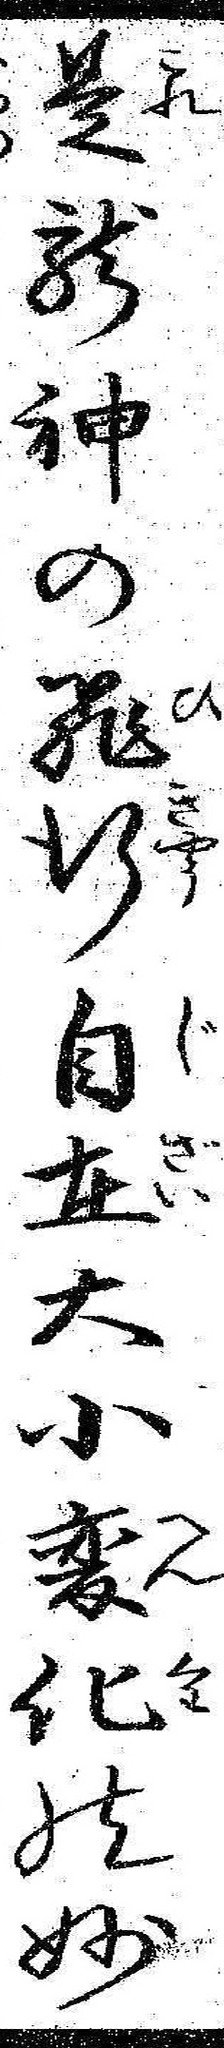是竜神の飛行自在大小変化の妙
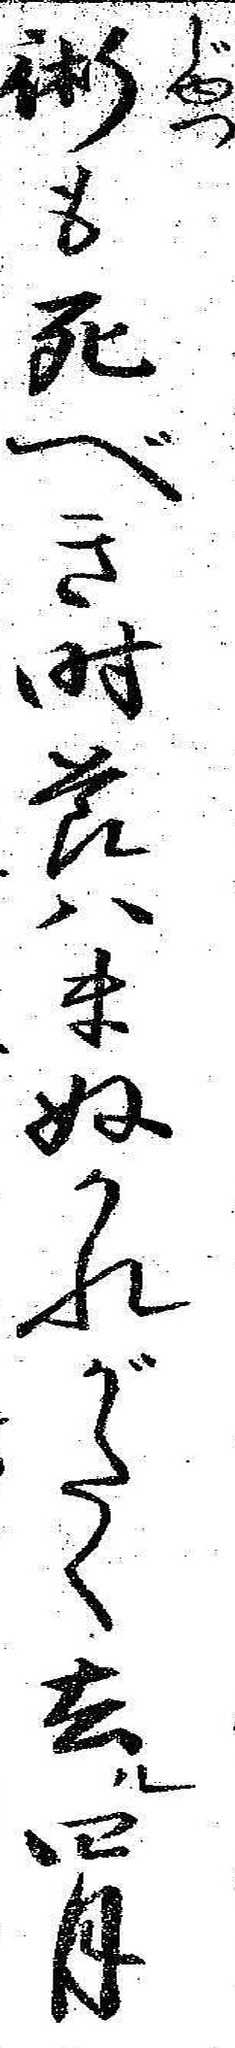術も死べき時節はまぬかれがたく去四月
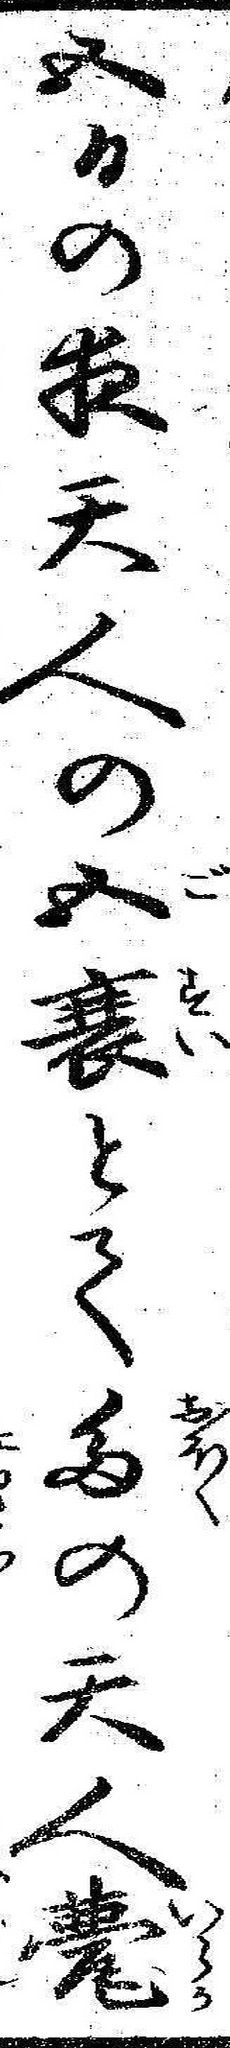五日の夜天人の五衰とて多の天人甍
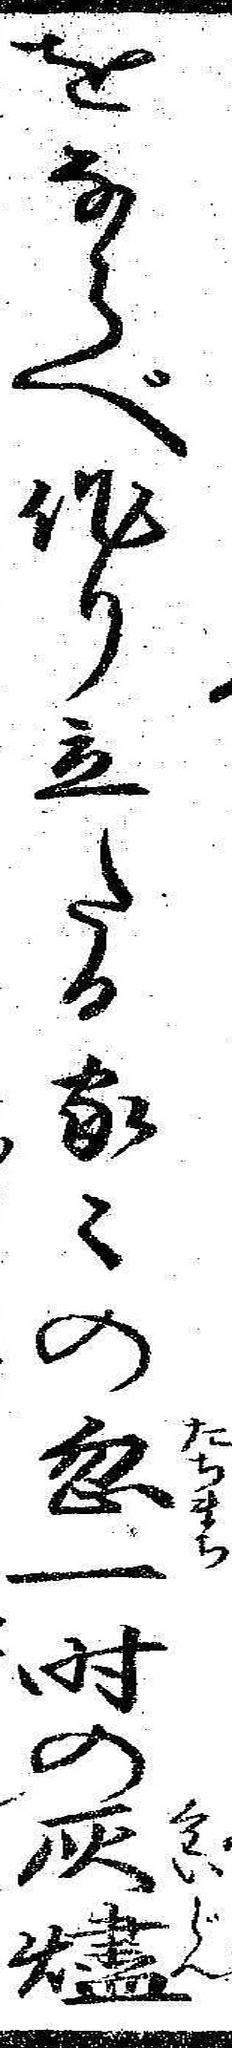をならべ作り立たる家々の忽一時の灰塵
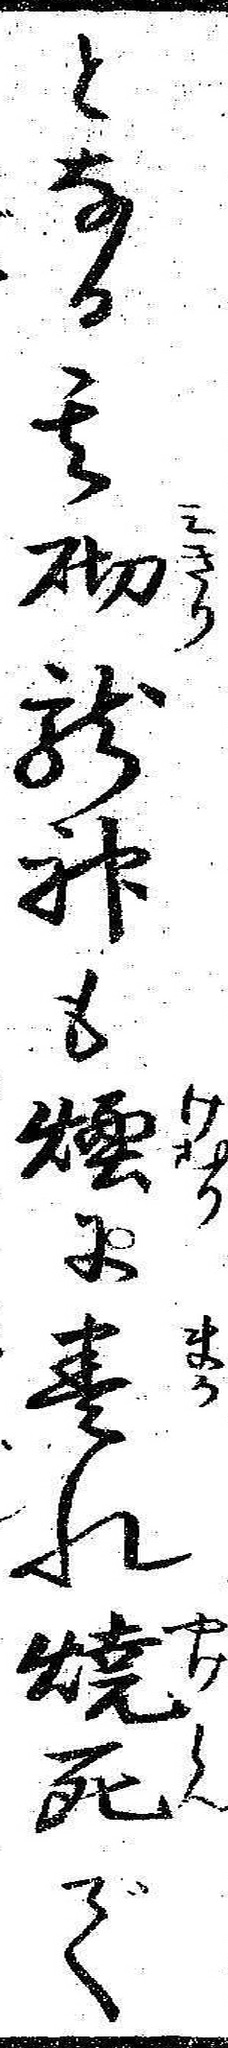となる其砌竜神も煙に巻れ焼死で
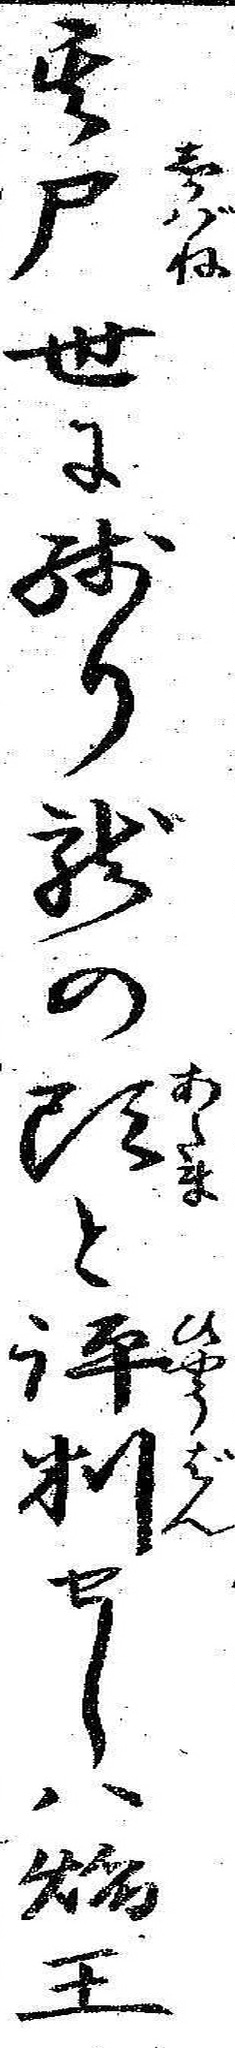其尸世に残り竜の頭と評判せしは焔王
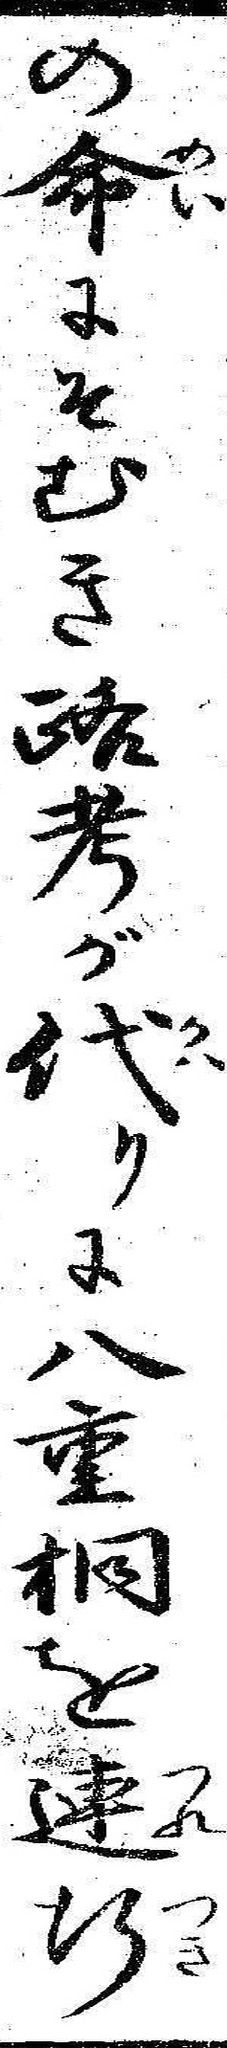の命にそむき路考が代八重桐を連行
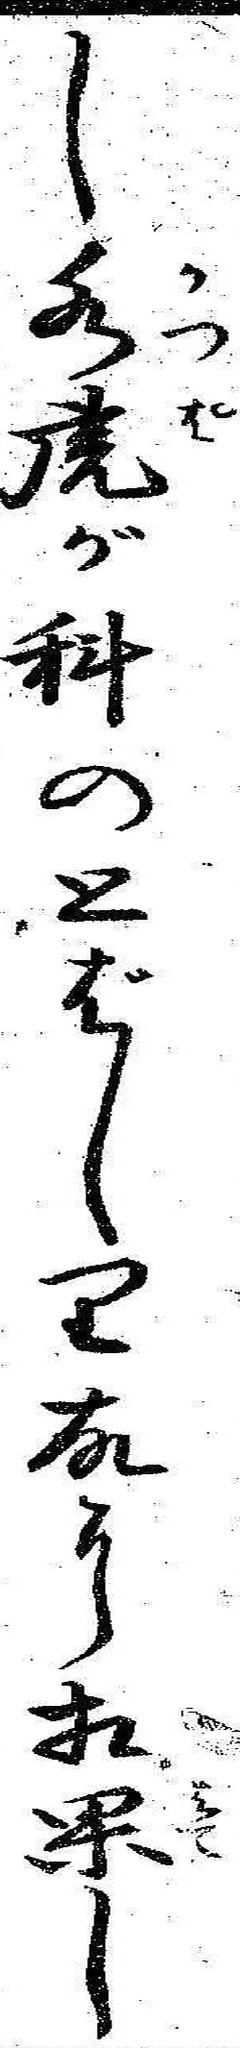し水虎が科のとばしり故に相果し
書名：根無草後編
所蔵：国文学研究資料館
